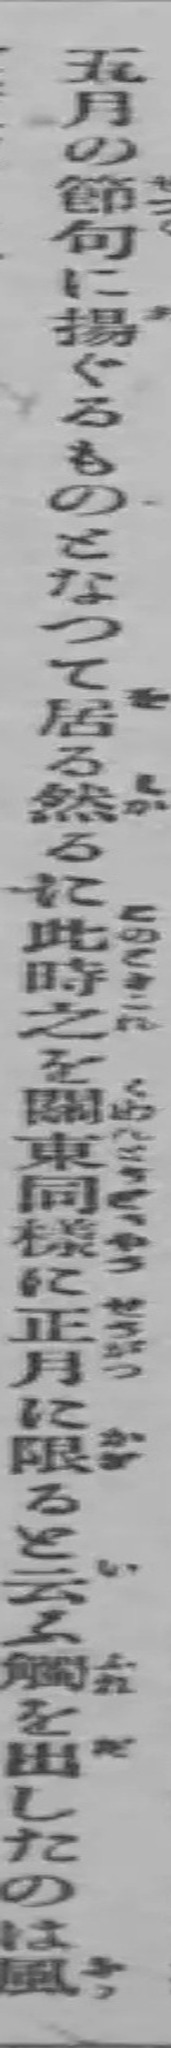五月の節句に揚ぐるものとなつて居る然るに此時之を関東同様に正月に限ると云ふ觸を出したのは風
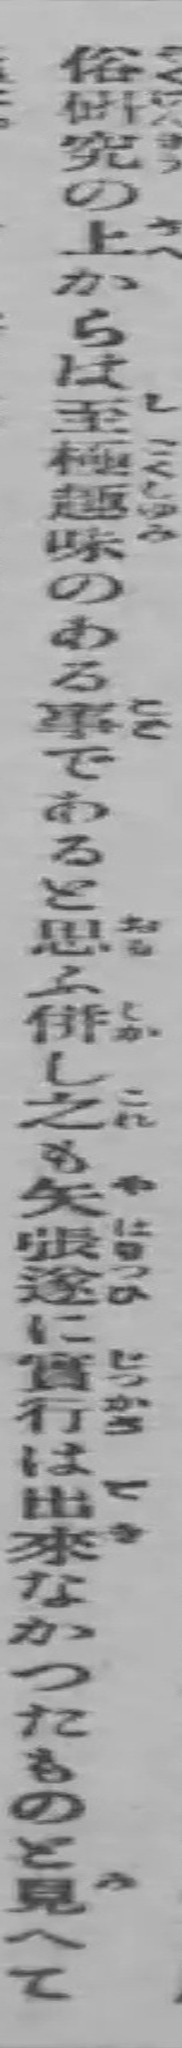俗研究の上からは至極趣味のある事であると思ふ併し之も矢張遂に実行は出来なかつたものと見へて
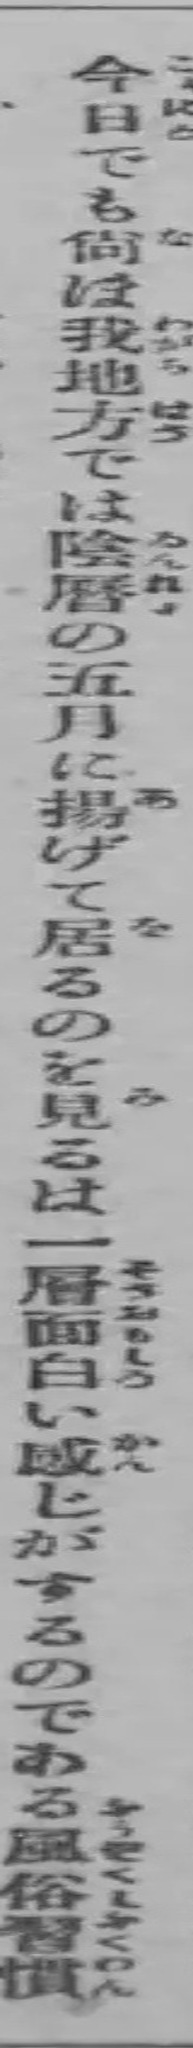今日でも尚ほ我地方では陰暦の五月に揚げて居るのを見るは一層面白い感じがするのである風俗習慣
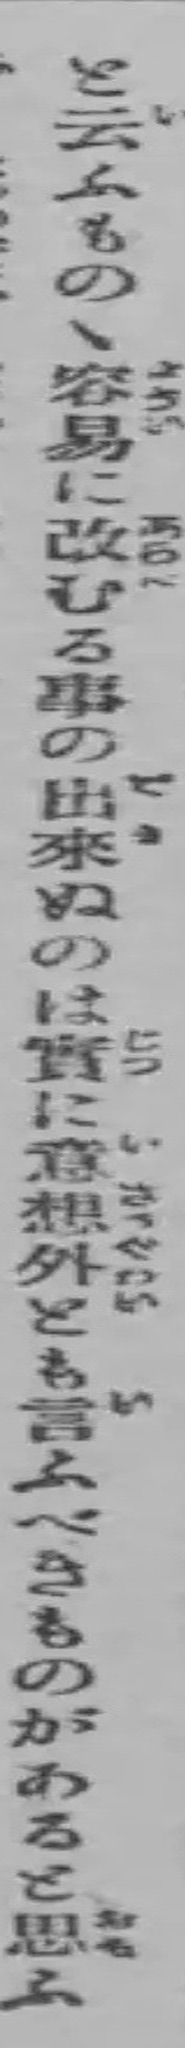と云ふものゝ容易に改むる事の出来ぬのは実に意想外とも言ふべきものがあると思ふ
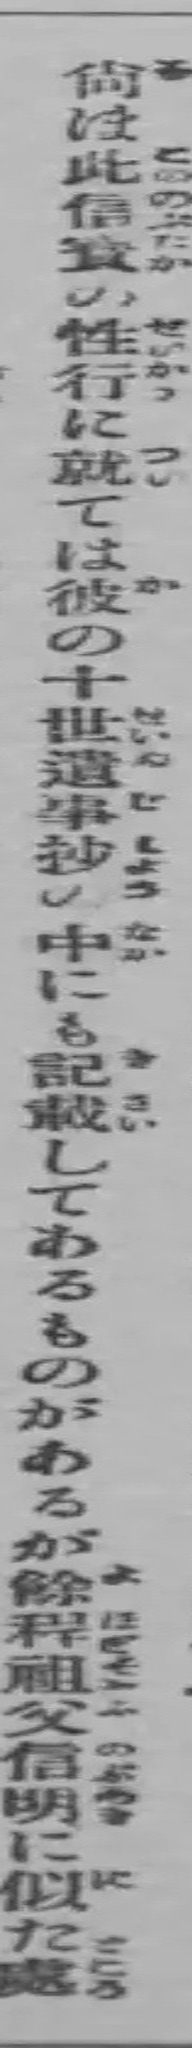信寶の逸事尚ほ此信寶の性行に就ては彼の十世遺事抄の中にも記載してあるものがあるが余程祖父信明に似た処
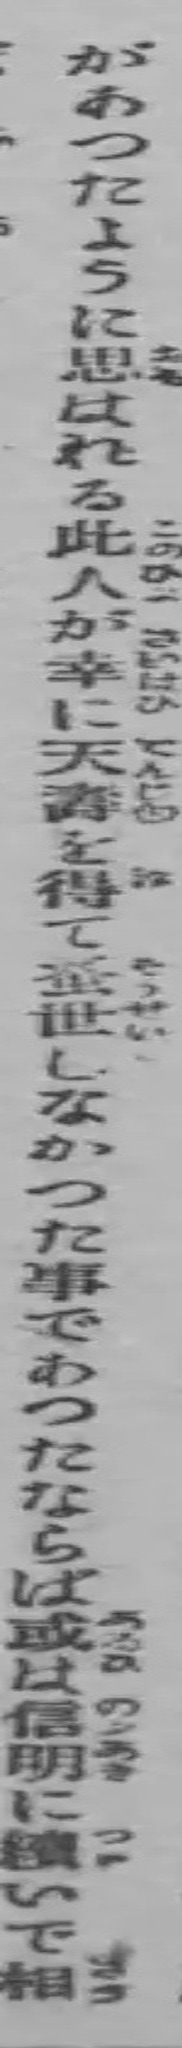があつたように思はれる此人が幸に天寿を得て蚤世しなかつた事であつたならば或は信明に続いで相
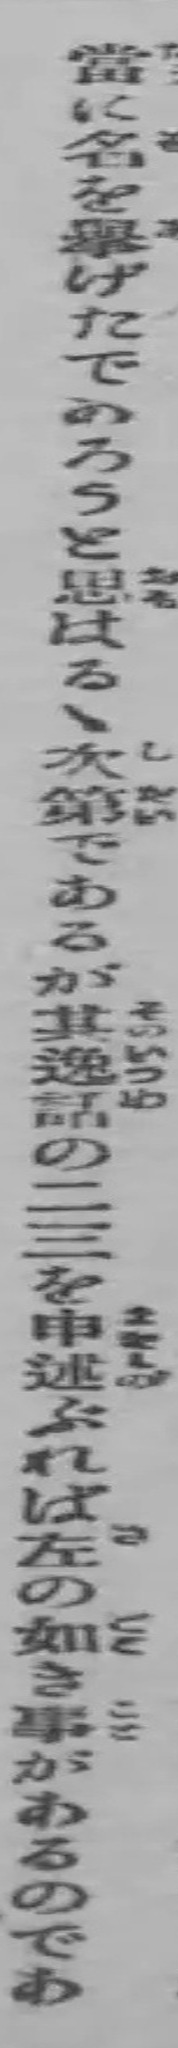名を挙げたであろうと思はるゝ次第であるが其逸話の二三を申述ぶれば左の如き事があるのであ
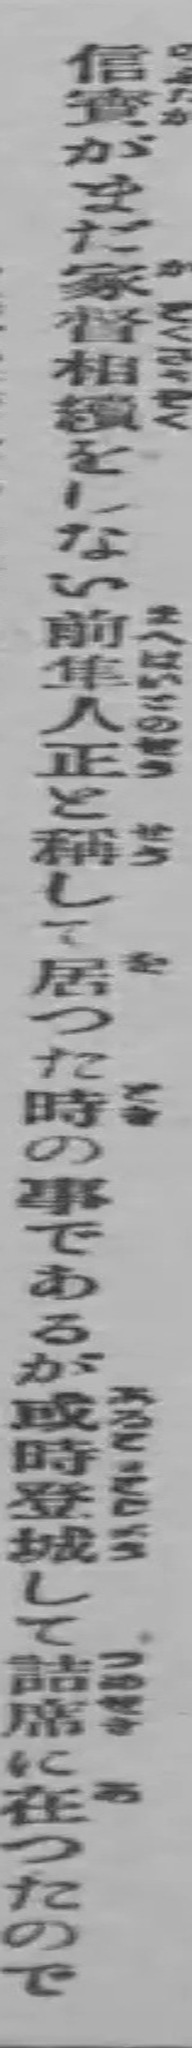信寶がまだ家督相続をしない前隼人正と称して居つた時の事であるが或時登城して詰席に在つたので
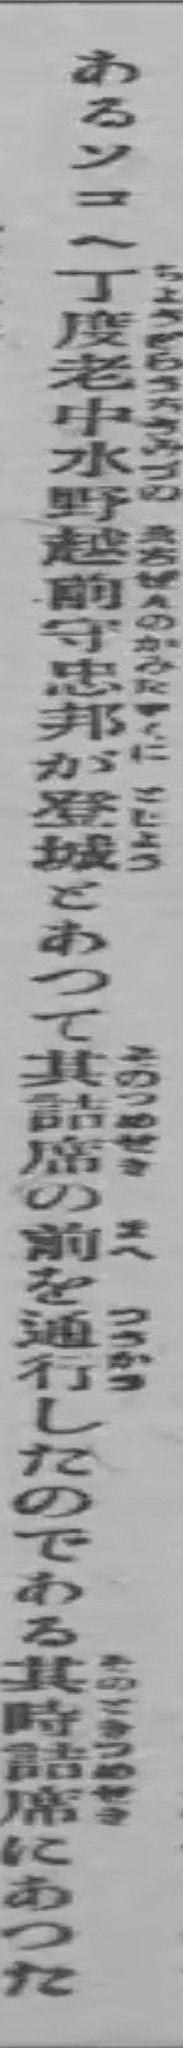あるソコへ丁度老中水野越前守忠邦が登城とあつて其詰席の前を通行したのである其時詰席にあつた
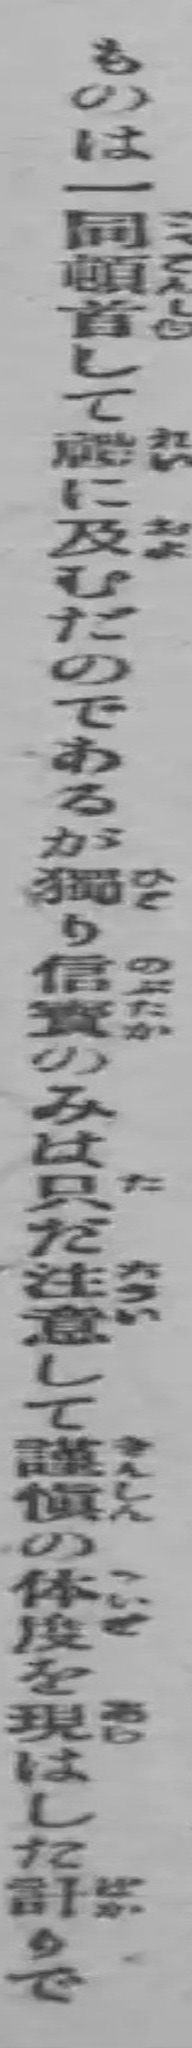ものは一同頓首して礼に及むだのであるが独り信寶のみは只だ注意して謹慎の体度を現はした計りで
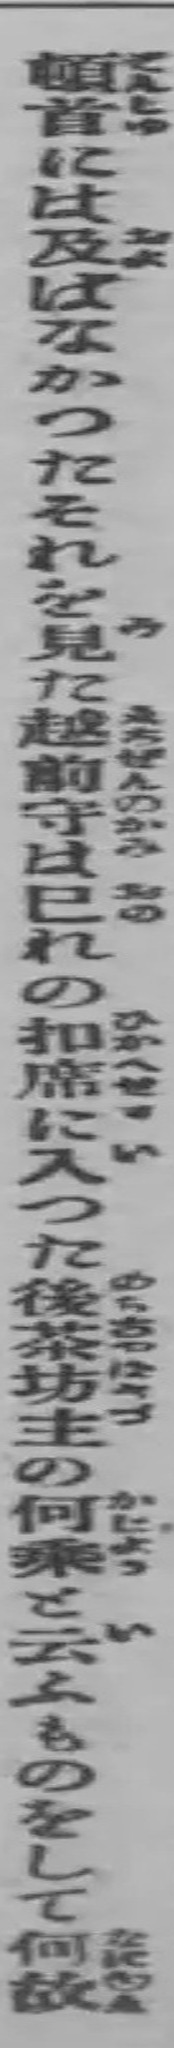頓首には及ばなかつたそれを見た越前守は巳れの扣席に入つた後茶坊主の何乗と云ふものをして何故
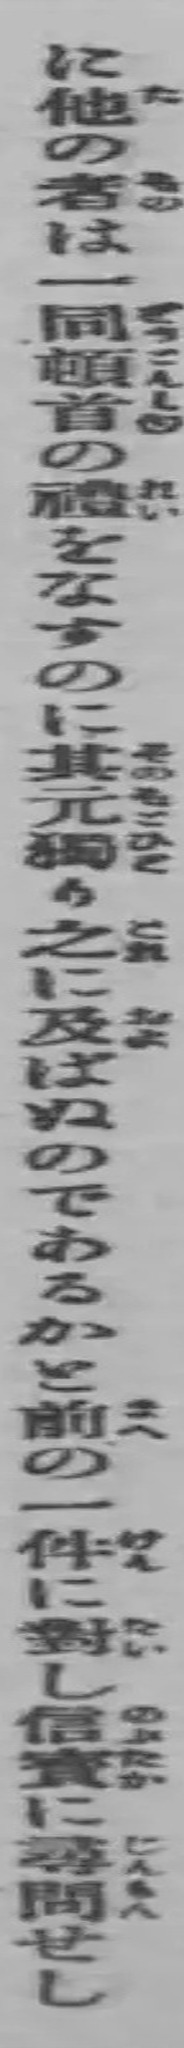に他の者は一同頓首の礼をなすのに其元独り之に及ばぬのであるかと前の一件に対し信寶に尋問せし
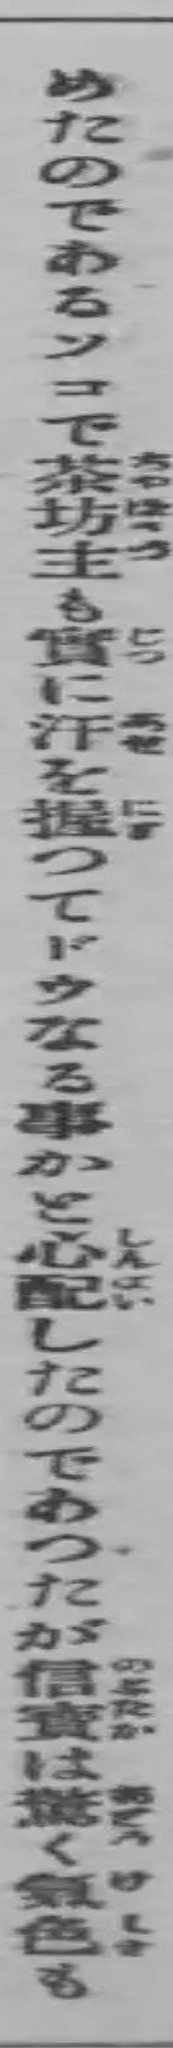めたのであるソコで茶坊主も実に汗を握つてドウなる事かと心配したのであつたが信寶は驚く気色も
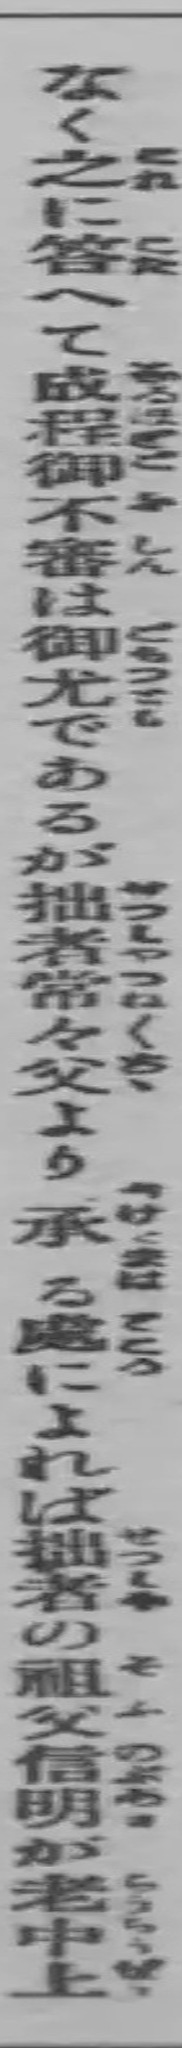なく之に答へて成程御不審は御尤であるが拙者常々父より承る処によれば拙者の祖父信明が老中上
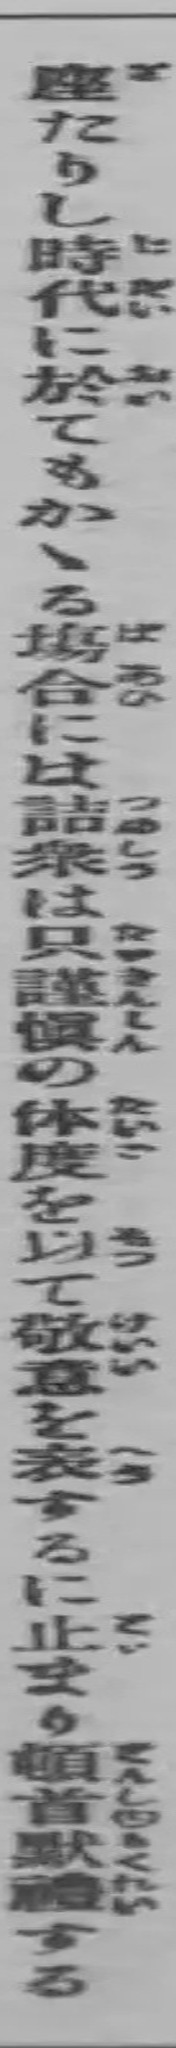座たりし時代に於てもかゝる場合には詰衆は只謹慎の体度を以て敬意を表するに止まり頓首黙礼する
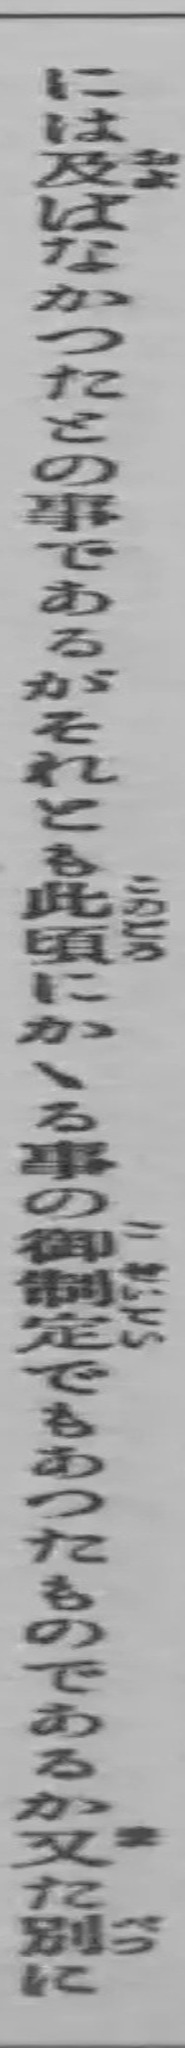には及ばなかつたとの事であるがそれとも此頃にかゝる事の御制定でもあつたものであるか又た別に
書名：豊橋市史談
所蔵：国立国会図書館 National Diet Library, JAPAN
